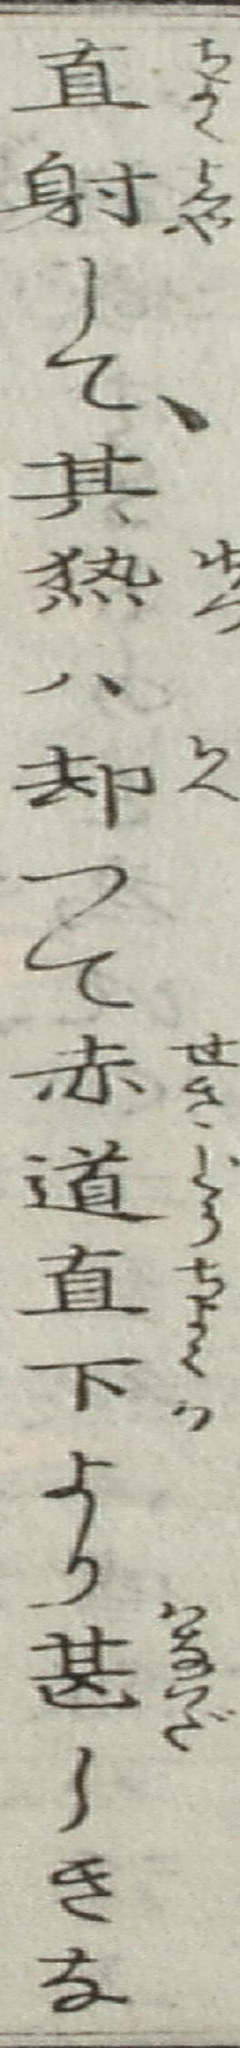直射して、其熱は却つて赤道直下より甚しきな
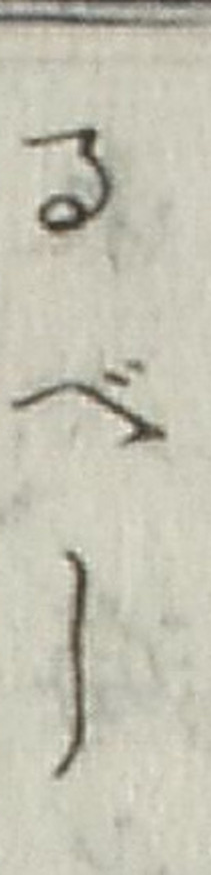るべし
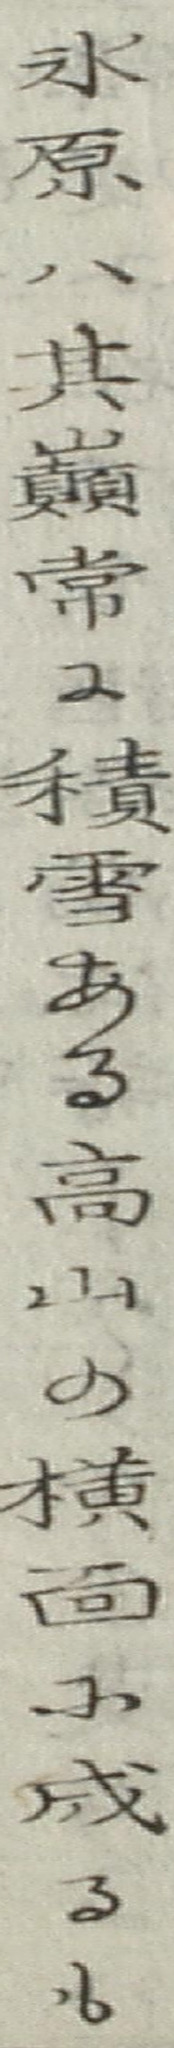氷原は其巓常に積雪ある高山の横面に成るも
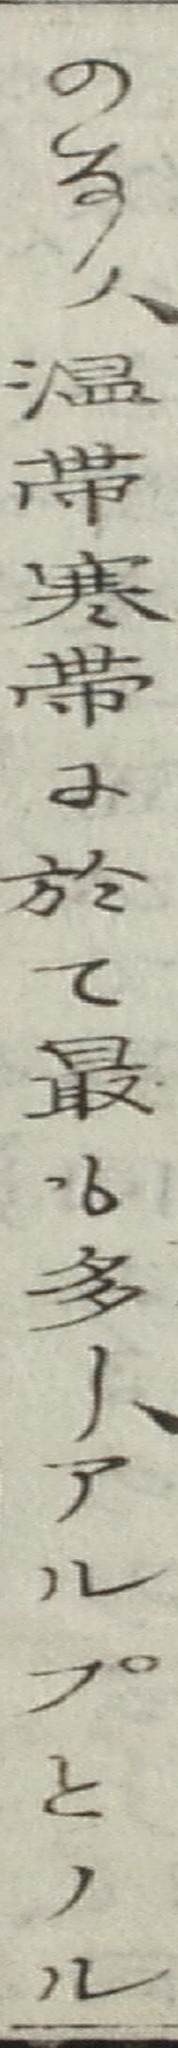のなり、温帯寒帯に於て最も多し、アルプとノル
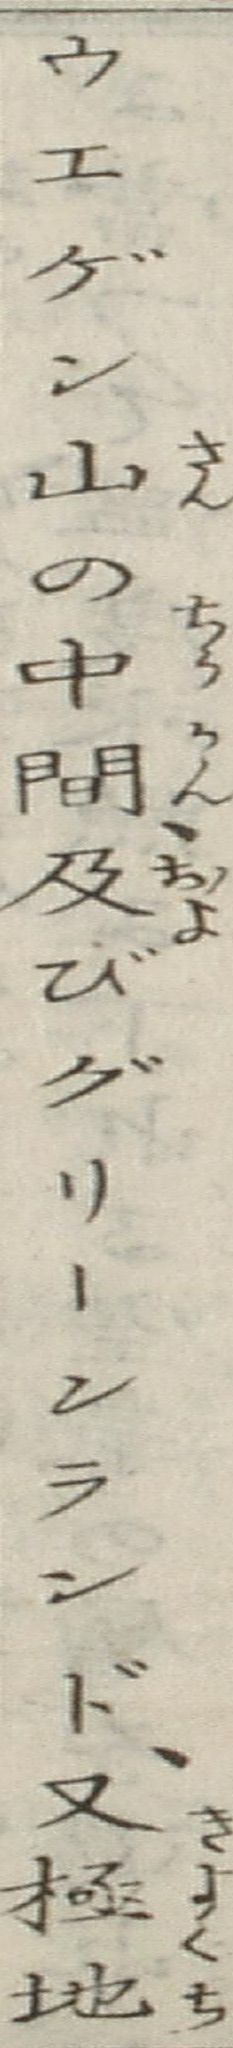ウエゲン山の中間、及びグリーンランド、又極地
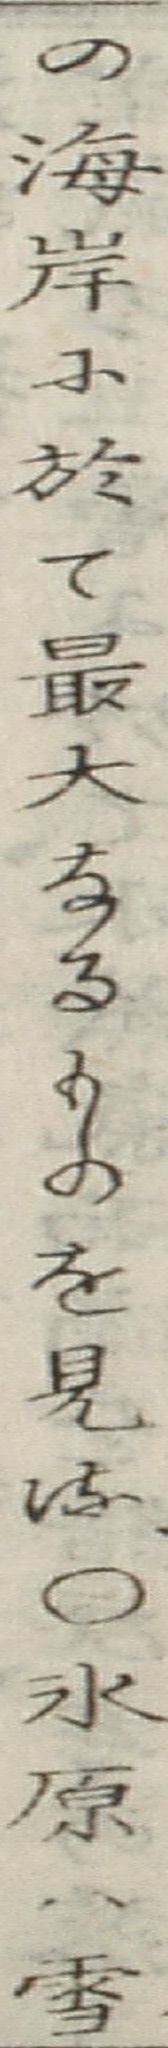の海岸に於て最大なるものを見る、〇氷原は雪
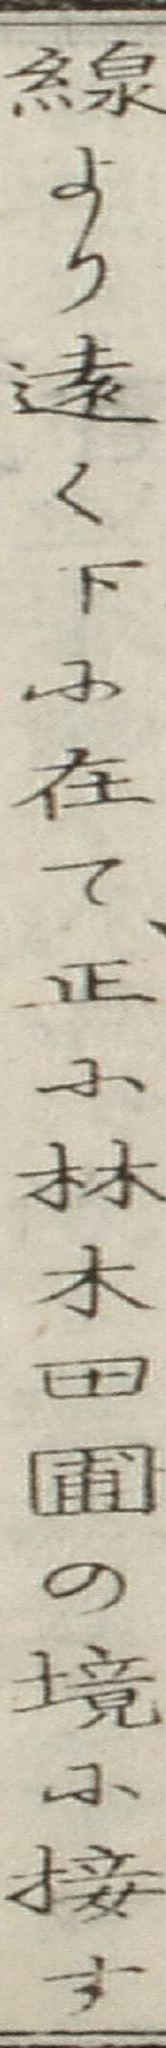線より遠く下に在て、正に林木田圃の境に接す
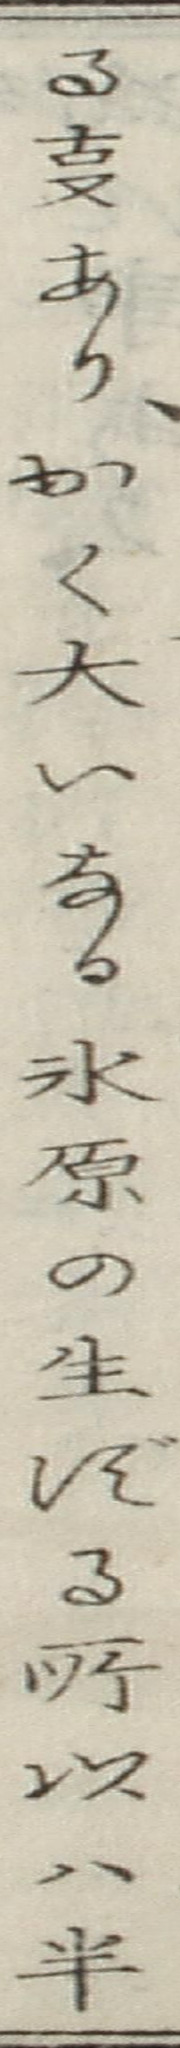る事あり、かく大いなる氷原の生ずる所以は、半
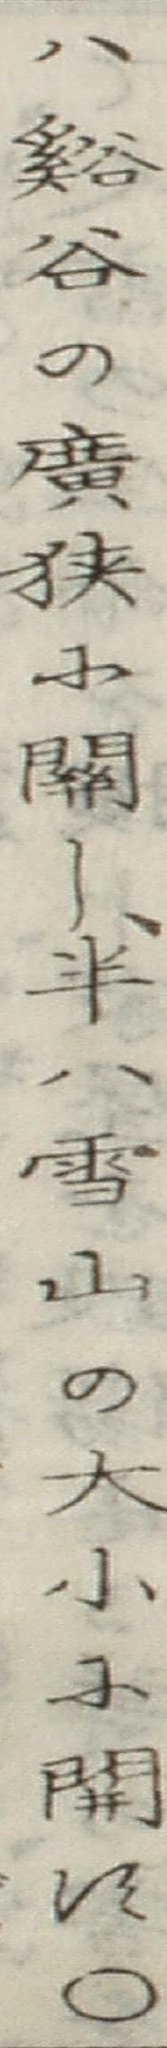は渓谷の広狭に関し、半は雪山の大小に関す、〇
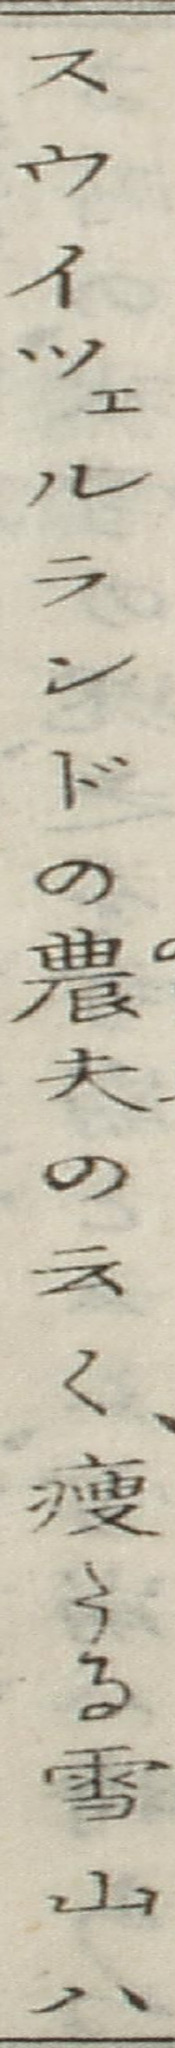スウイツェルランドの農夫の云く、痩たる雪山は
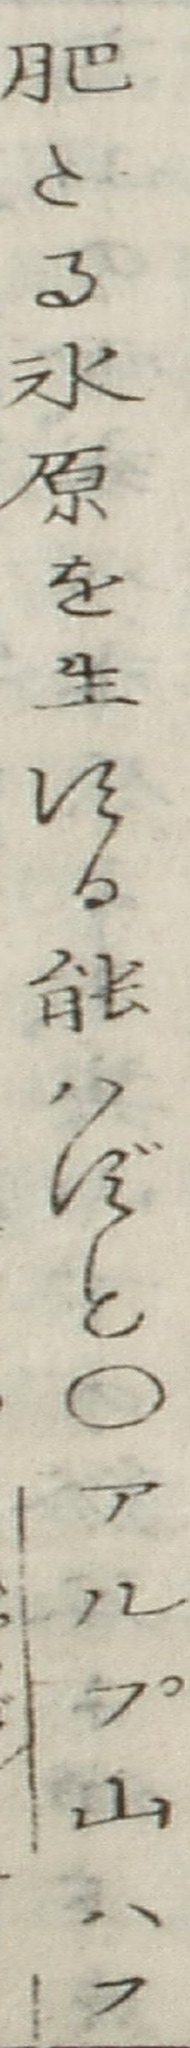肥たる氷原を生する能はずと〇アルプ山はフ
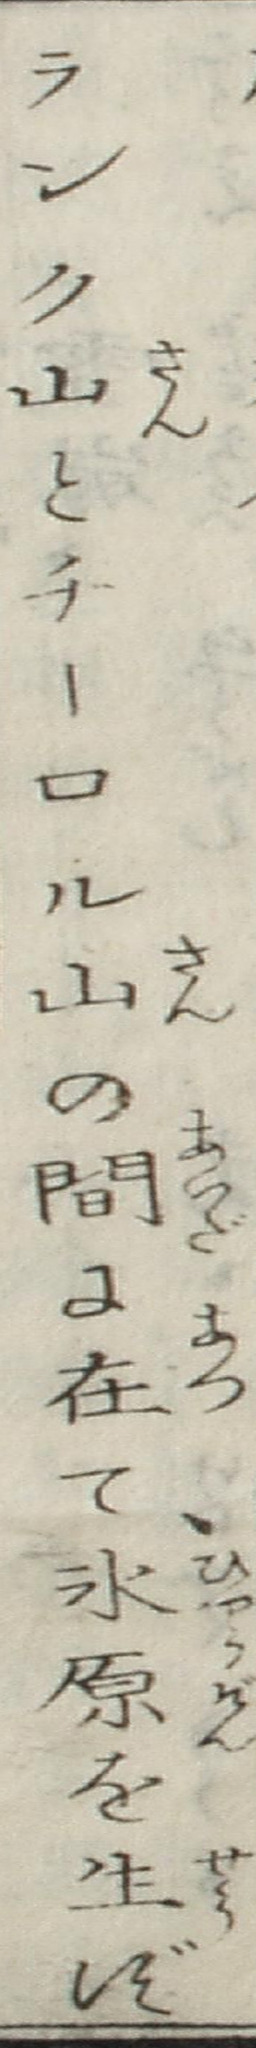ランク山とチーロル山の間に在て、氷原を生ず
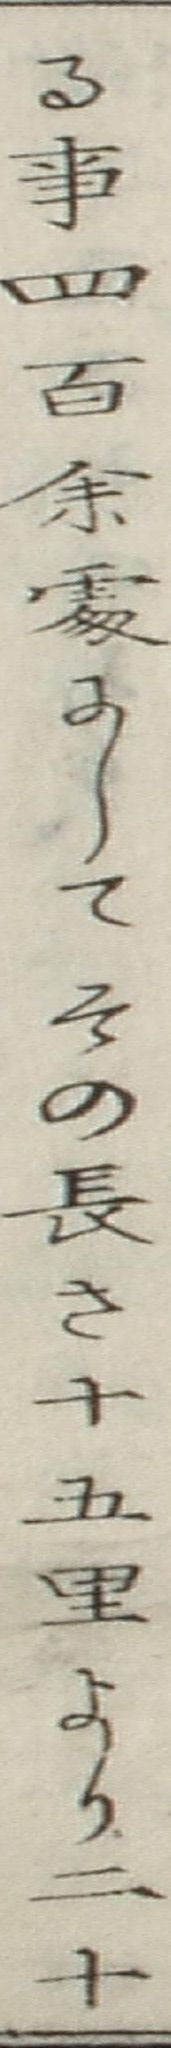る事四百余処にして、その長さ十五里より、二十

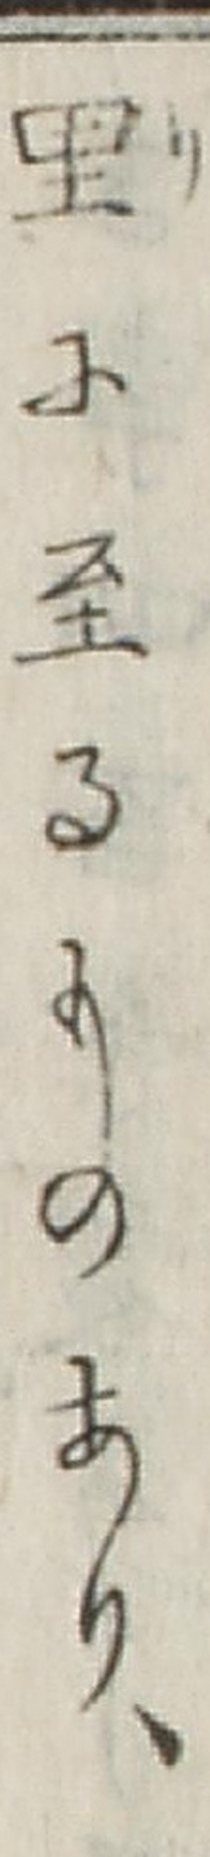里に至るものあり、
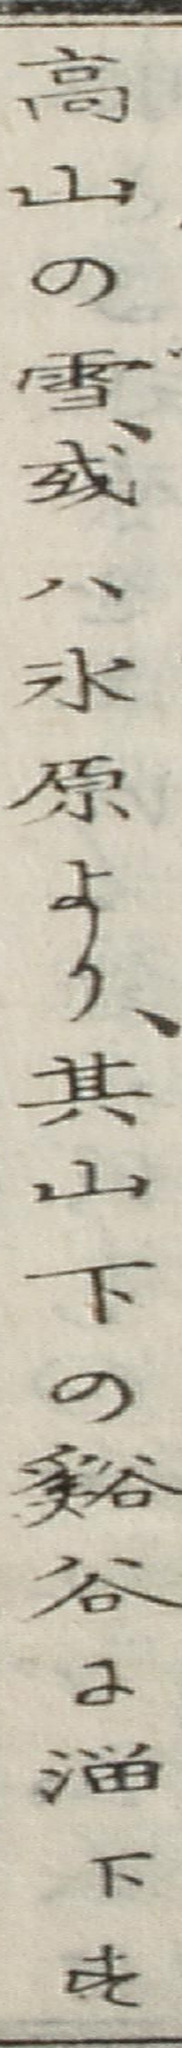高山の雪、或は氷原より、其山下の渓谷に溜下す
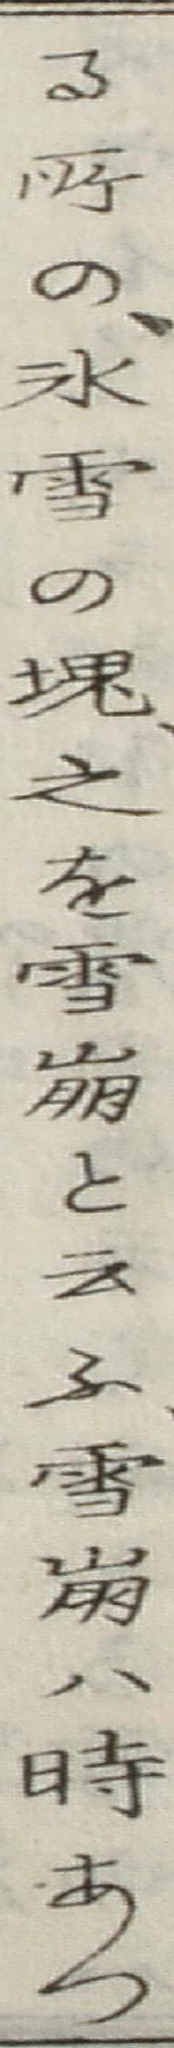る所の、氷雪の塊、之を雪崩と云ふ、雪崩は時あつ
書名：訓蒙　天然地理學　下
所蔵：東京大学地震研究所図書室 Earthquake Research Institute Library, The University of Tokyo, JAPAN
